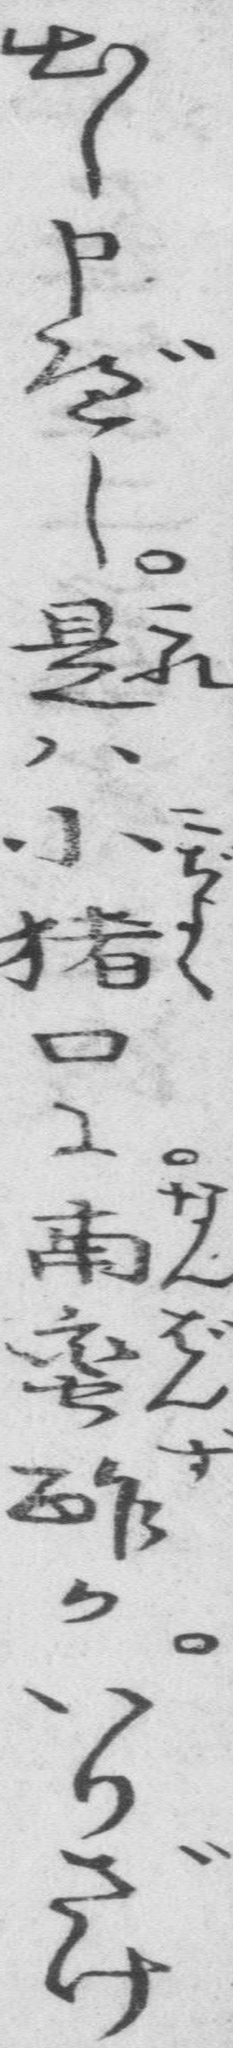出し申べし。是は小猪口に。南蛮酢か。いりざけ
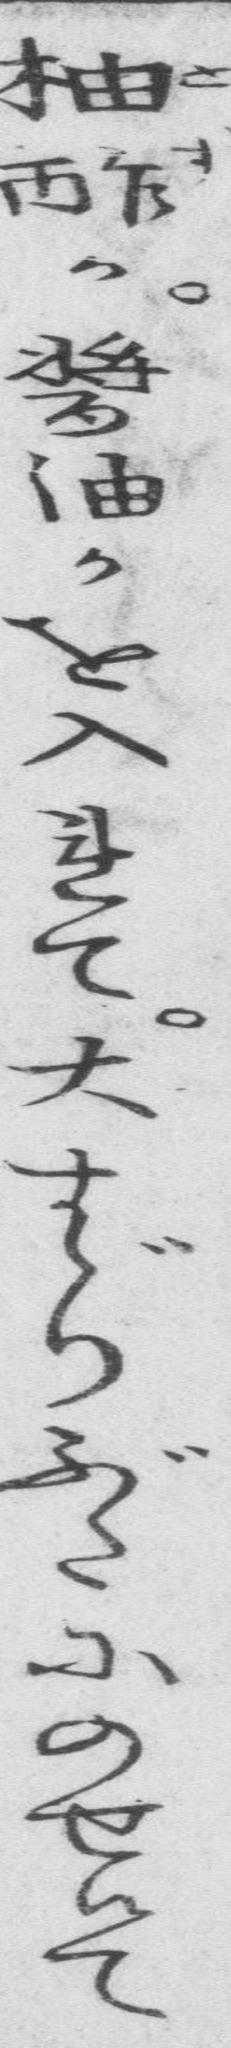柚酢か。醤油かを入れて。大すゞりぶたにのせ候て
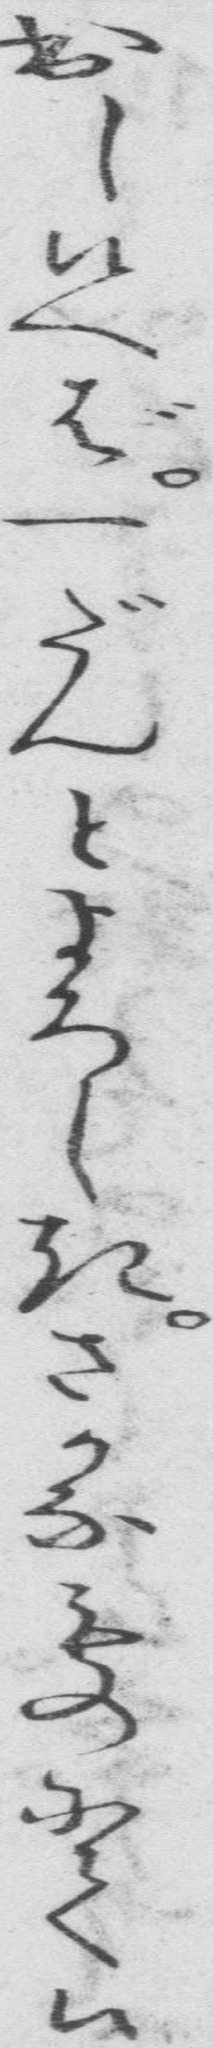出し候へば。一だんとよろしき。さかなものにて候
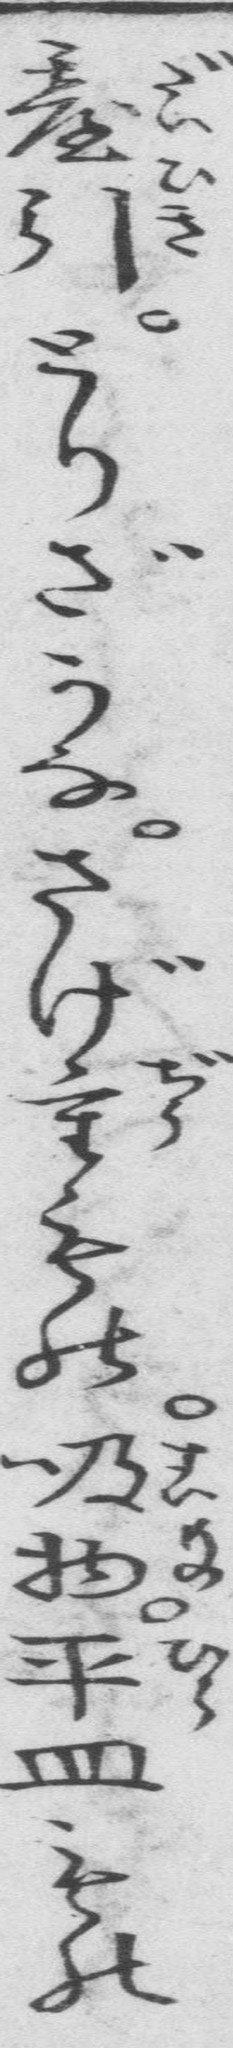台引。とりざかな。さげ重もの。吸物。平皿もの
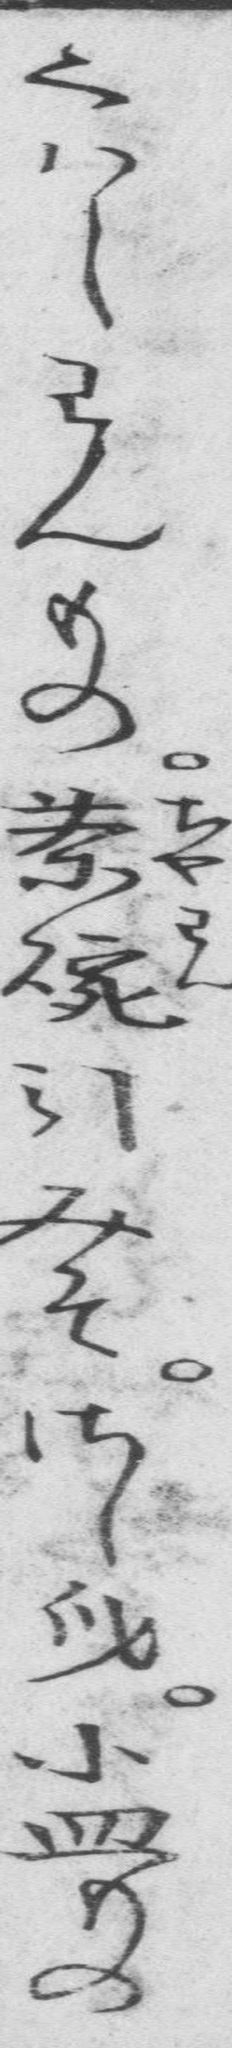くはしわんもの。茶碗引みそ。さし身。小皿もの
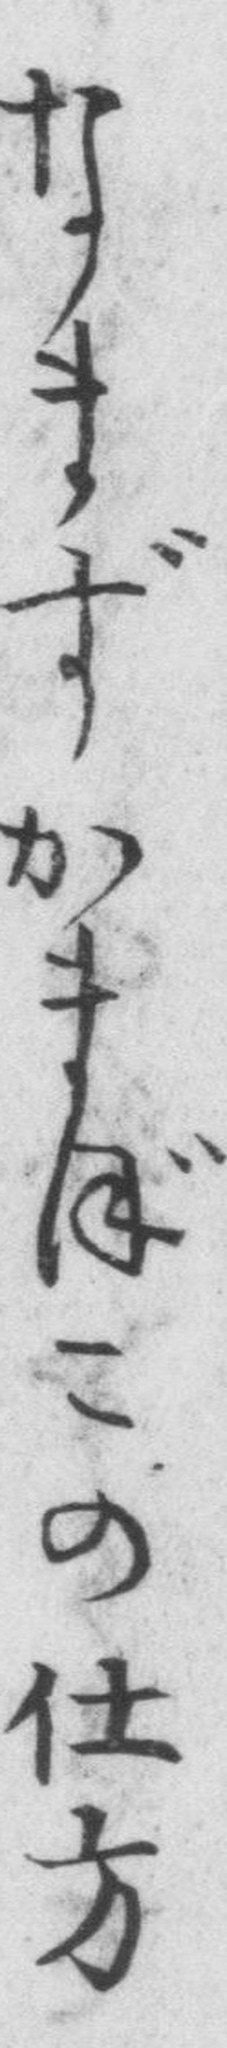なまずかまぼこの仕方
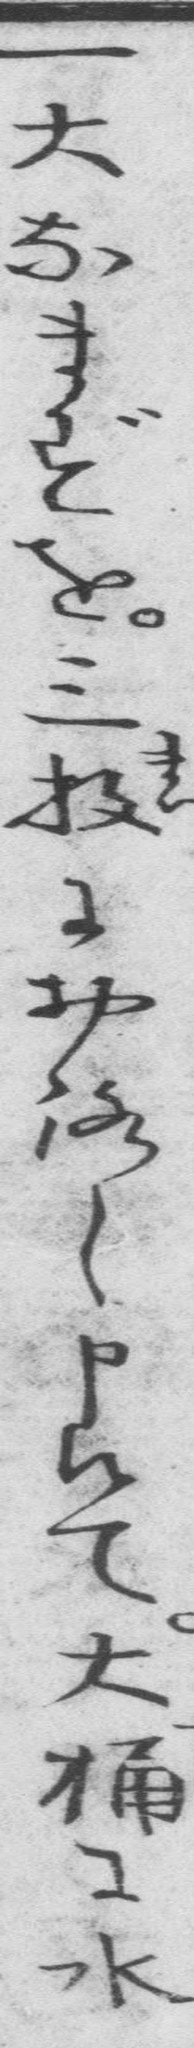一大なまずを。三枚におろし申候て。大桶に水
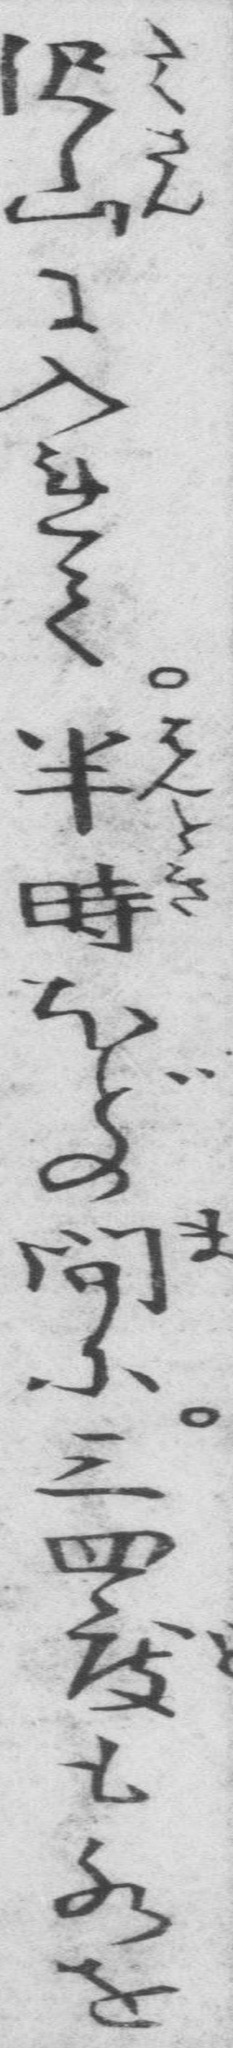沢山に入れて。半時ほどの間に。三四度も水を
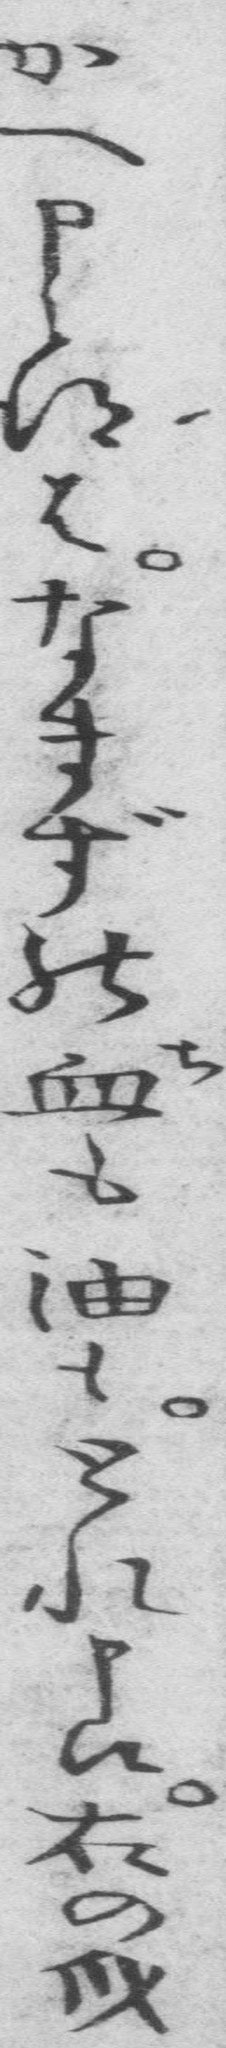かへ申候得は。なまずの血も油も。とれ申候。右の身

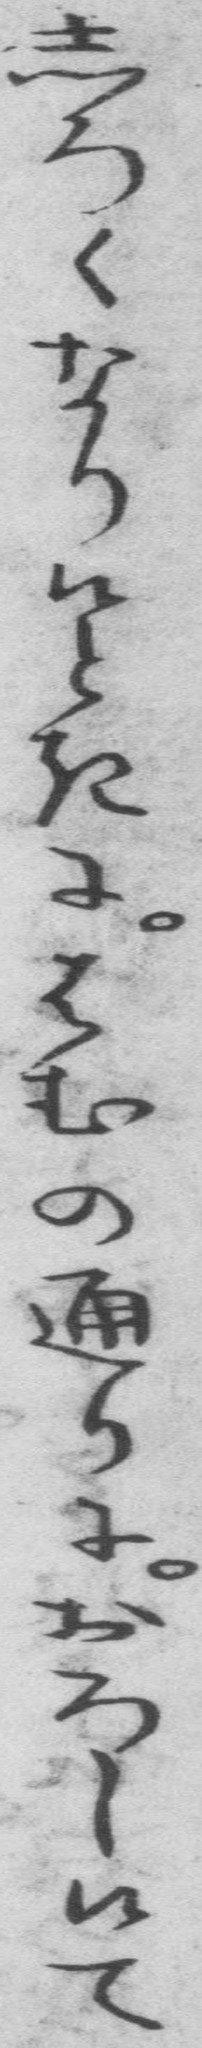しろくなり候ときに。はむの通りに。おろし候て
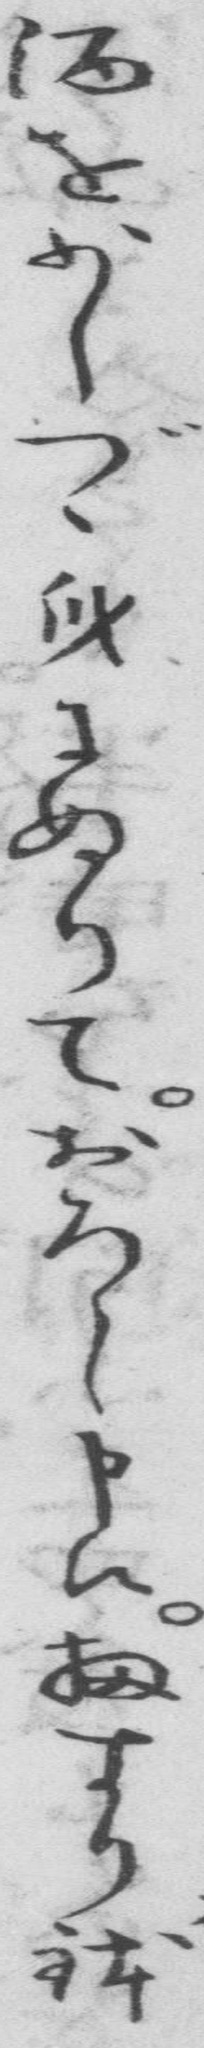酒を少しづゝ身にぬりて。おろし申候。扨すり鉢
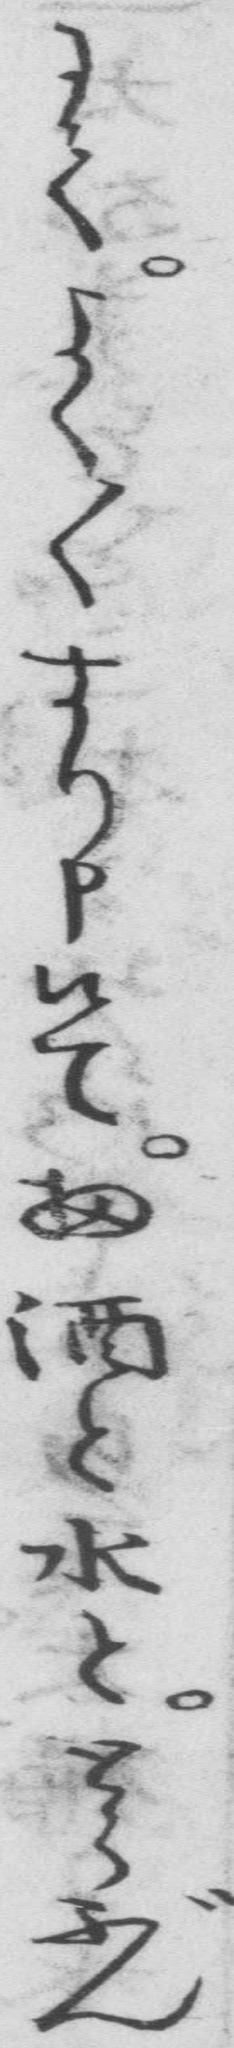にて。よく〳〵すり申候て。扨酒と水と。とうぶん
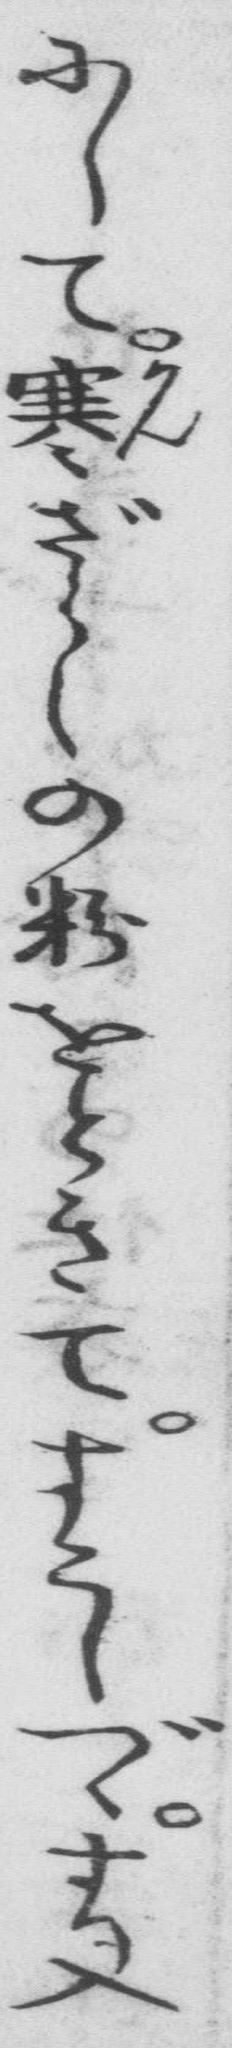にして。寒ざらしの粉をときて。すこしづゝ。すり入
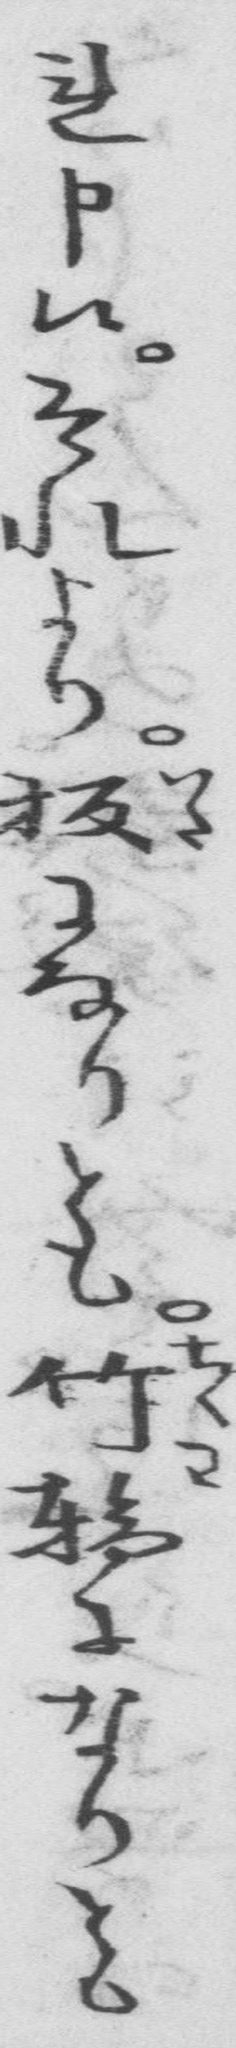れ申候。それより。板になりとも。竹輪になりとも
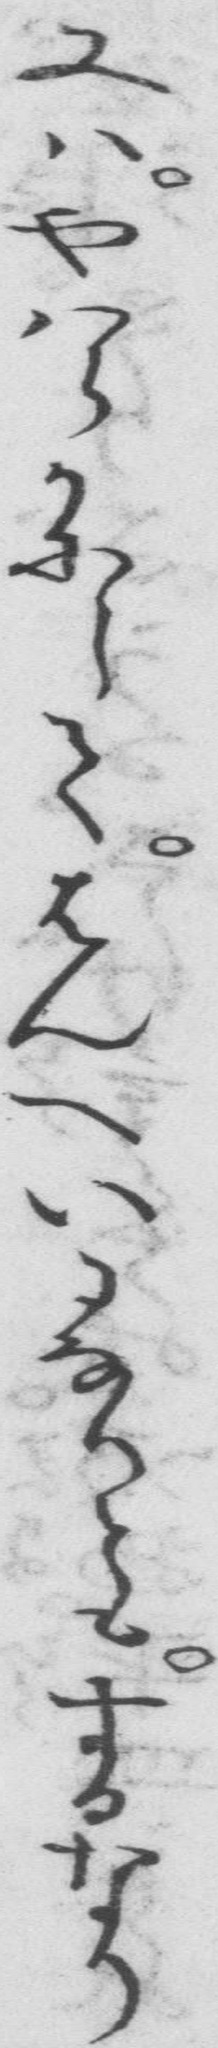又は。やはらかにして。はんへいになりとも。するなり
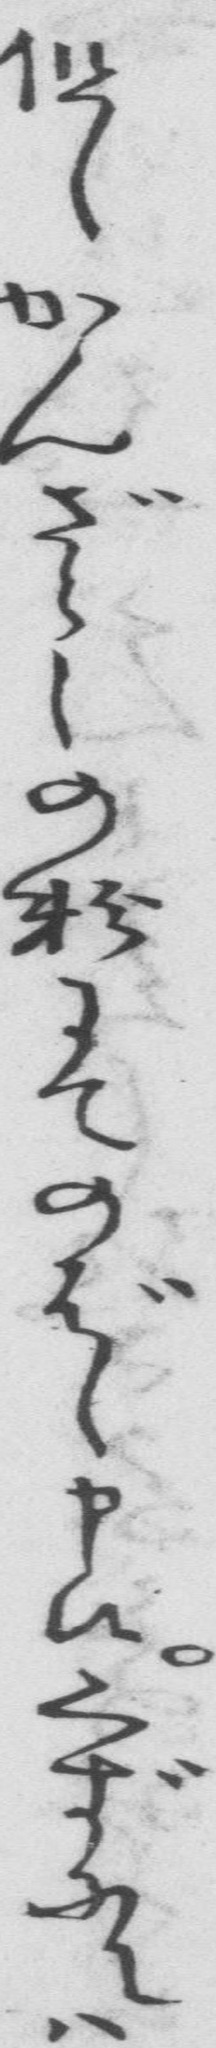但しかんざらしの粉にてのばし申候。くずにては
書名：萬寳料理秘密箱
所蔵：大阪府立大学学術情報センター 国文学研究資料館
